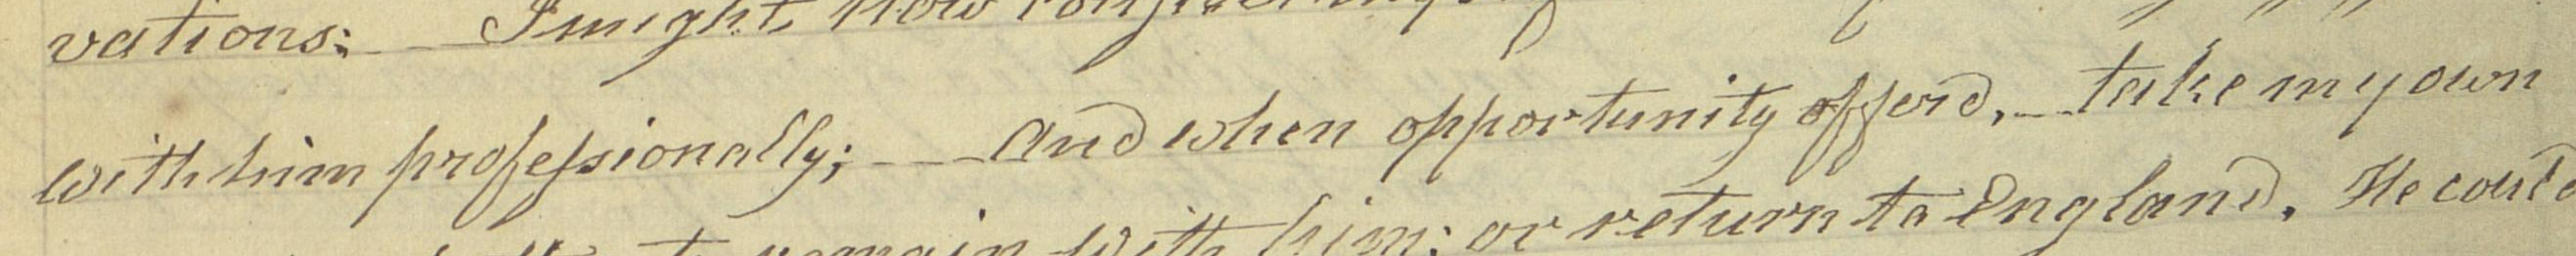with him professionally; And when opportunity offerd, take my own
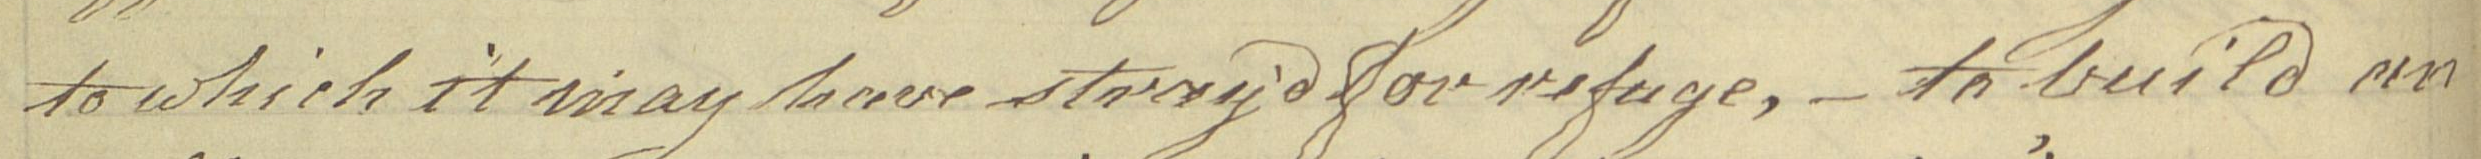to which it may have stray'd for refuge, to build an
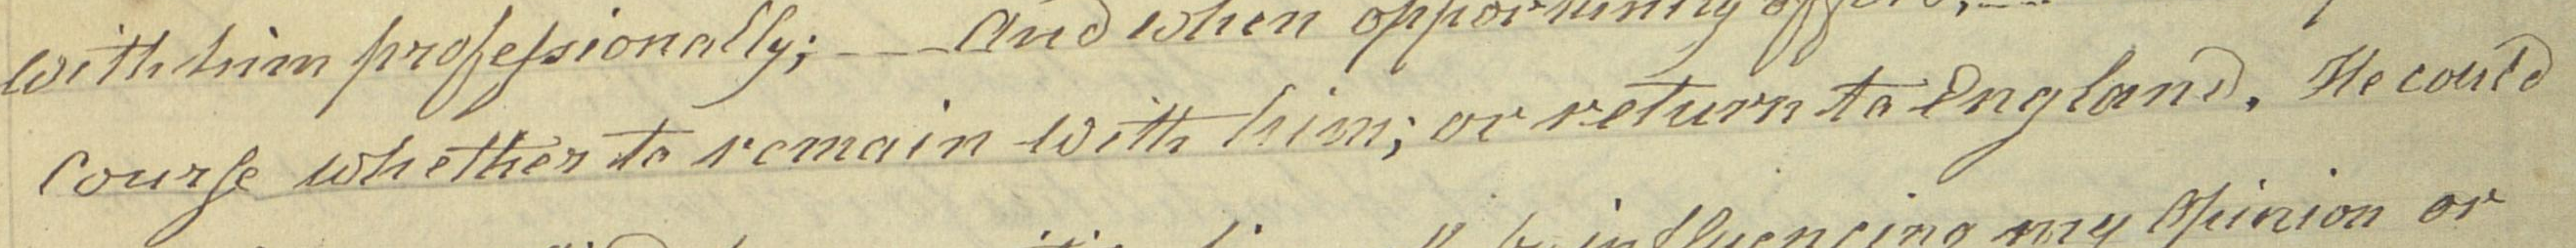course whether to remain with him; or return to England, He could
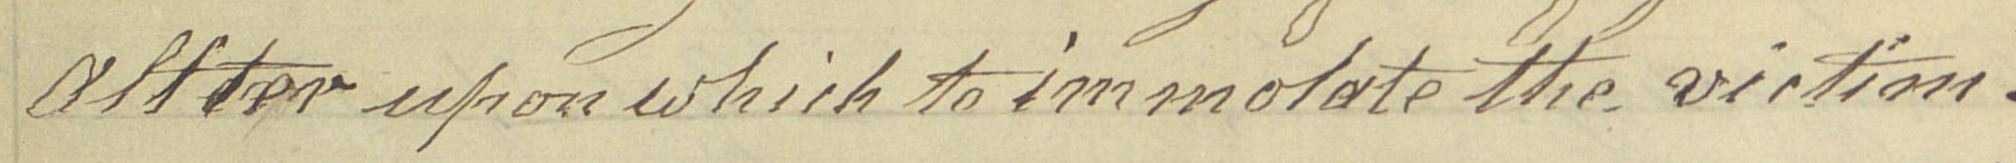alter upon which to immolate the victim."
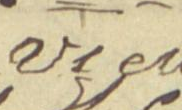view,
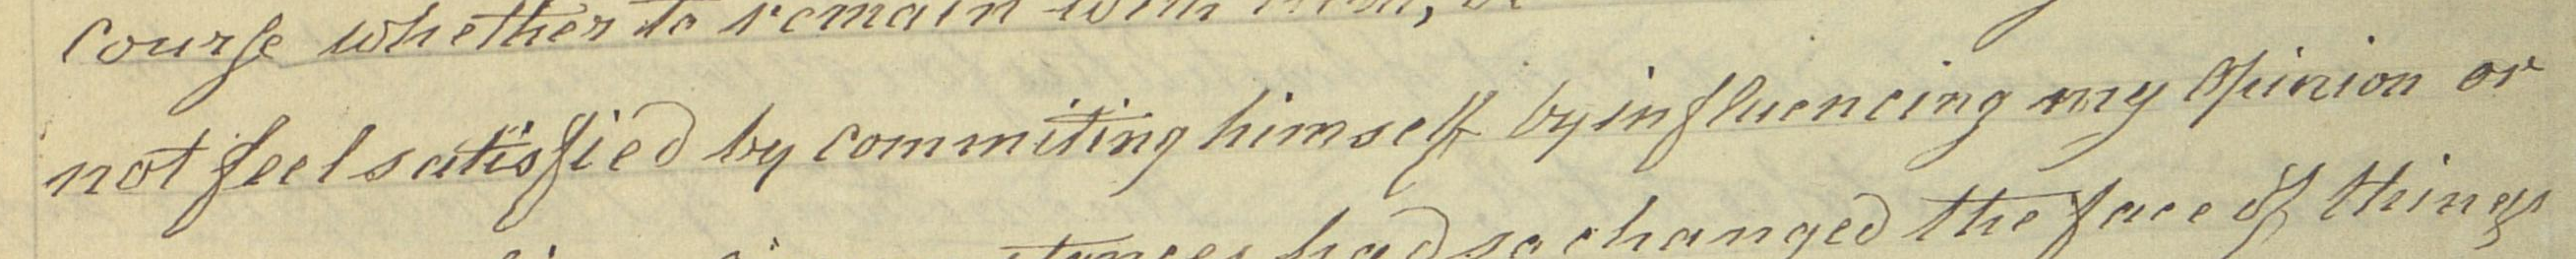not feel satisfied by commiting himself by influencing my opinion or
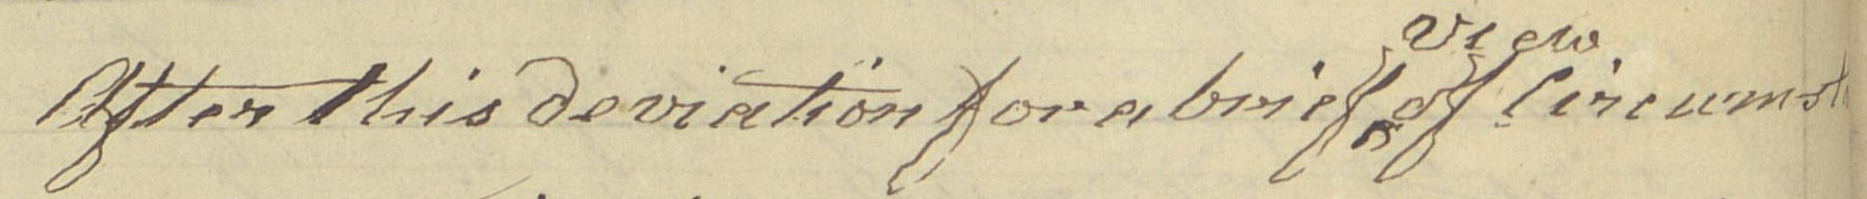After this deviation for a brief ^ of circumst-
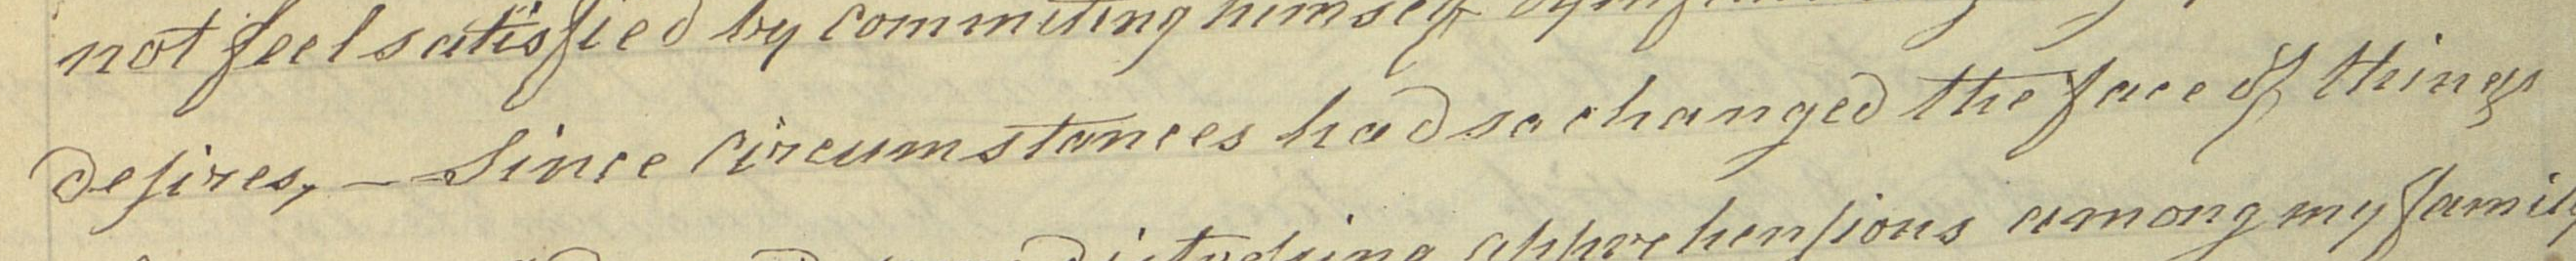desires, Since circumstances had so changed the face of things
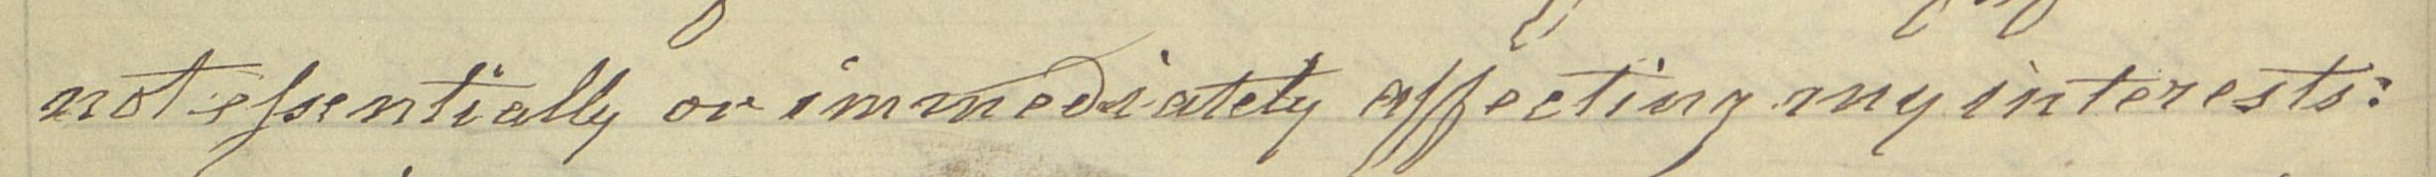not essentially or immediately affecting my interests:
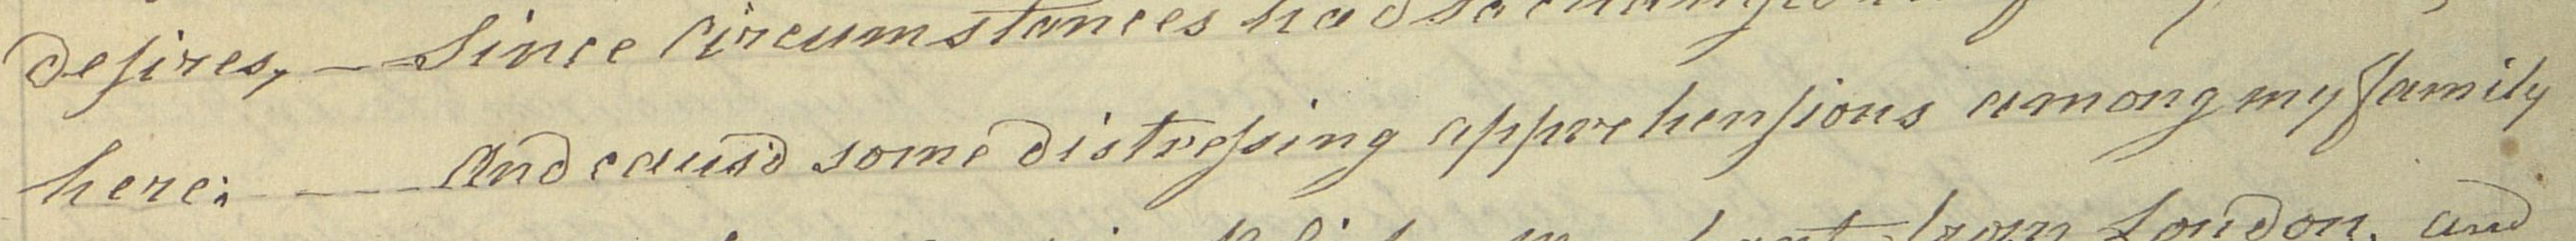here: And caus'd some distressing apprehensions among my family
